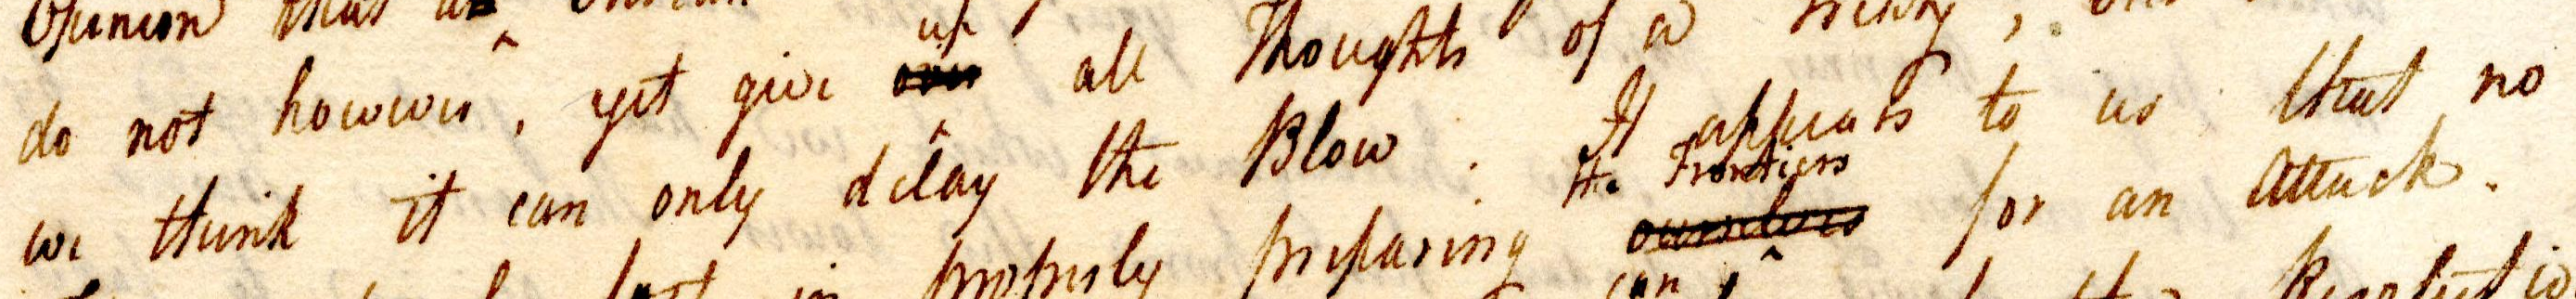we think it can only delay the Blow. It appears to us that no
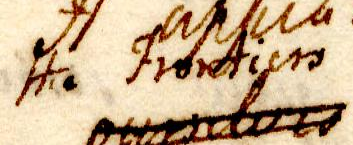the Frontiers
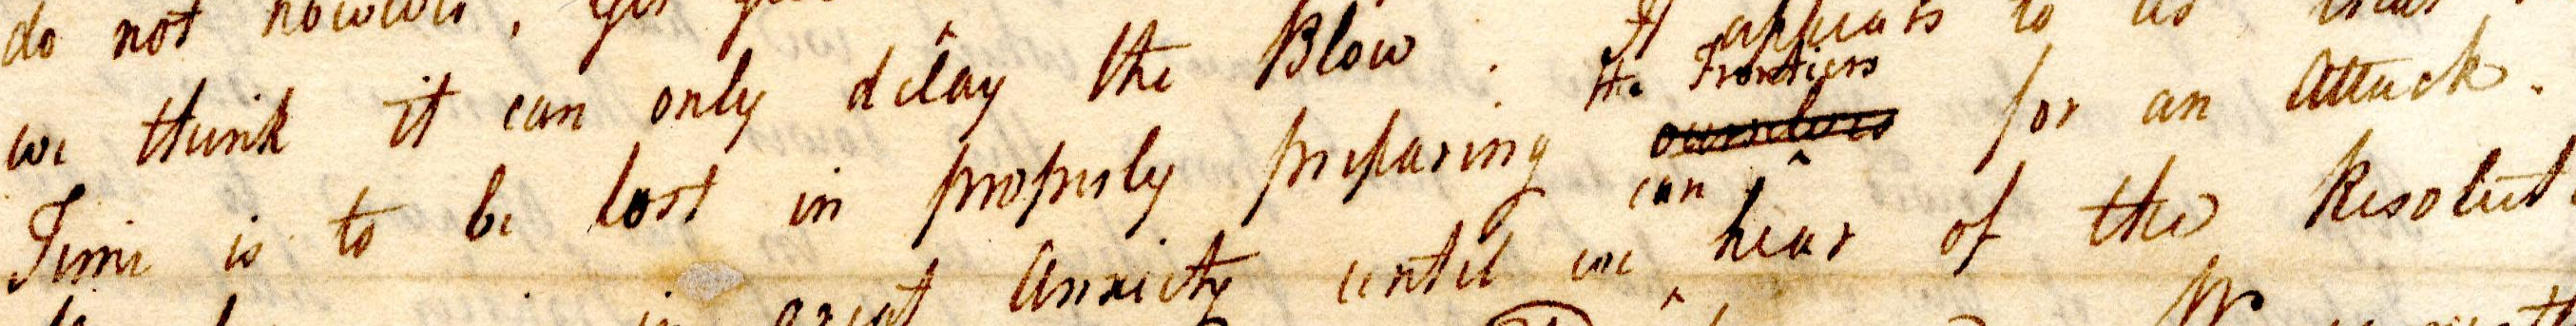Time is to be lost in properly preparing [ourselves] ^ for an attack.
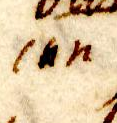can
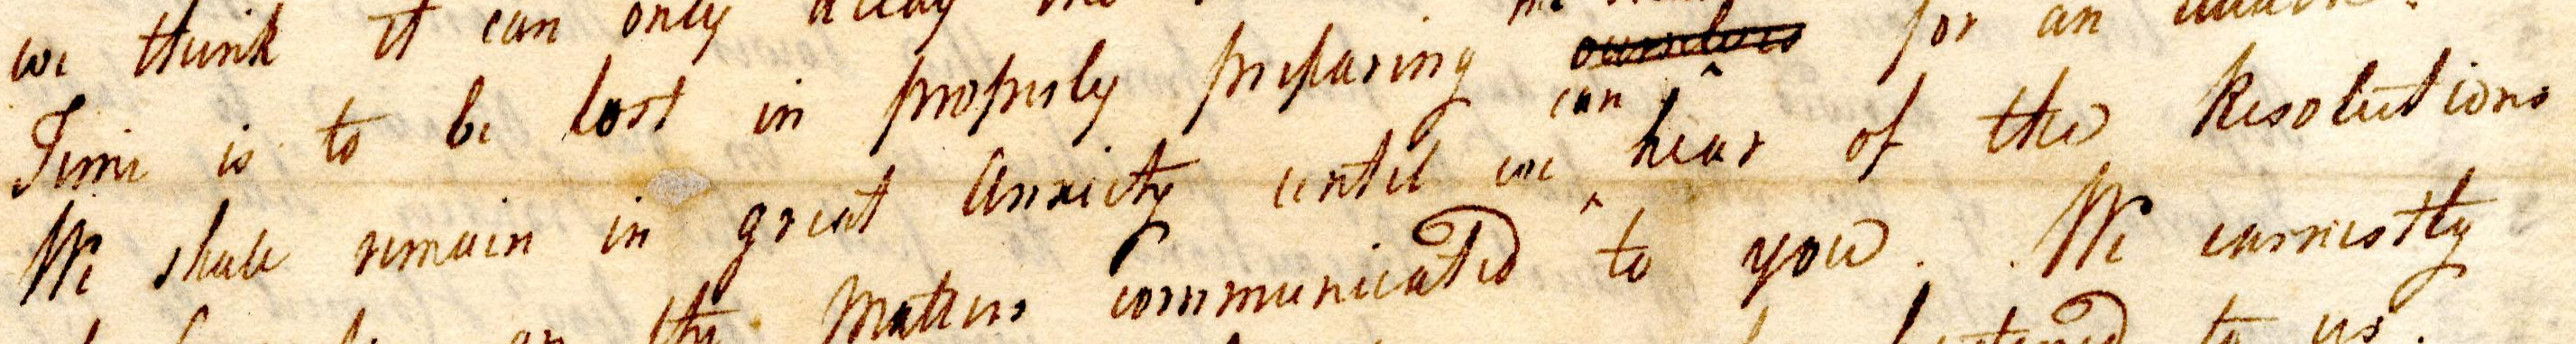We shall remain in great Anxiety until we ^ hear of the Resolutions
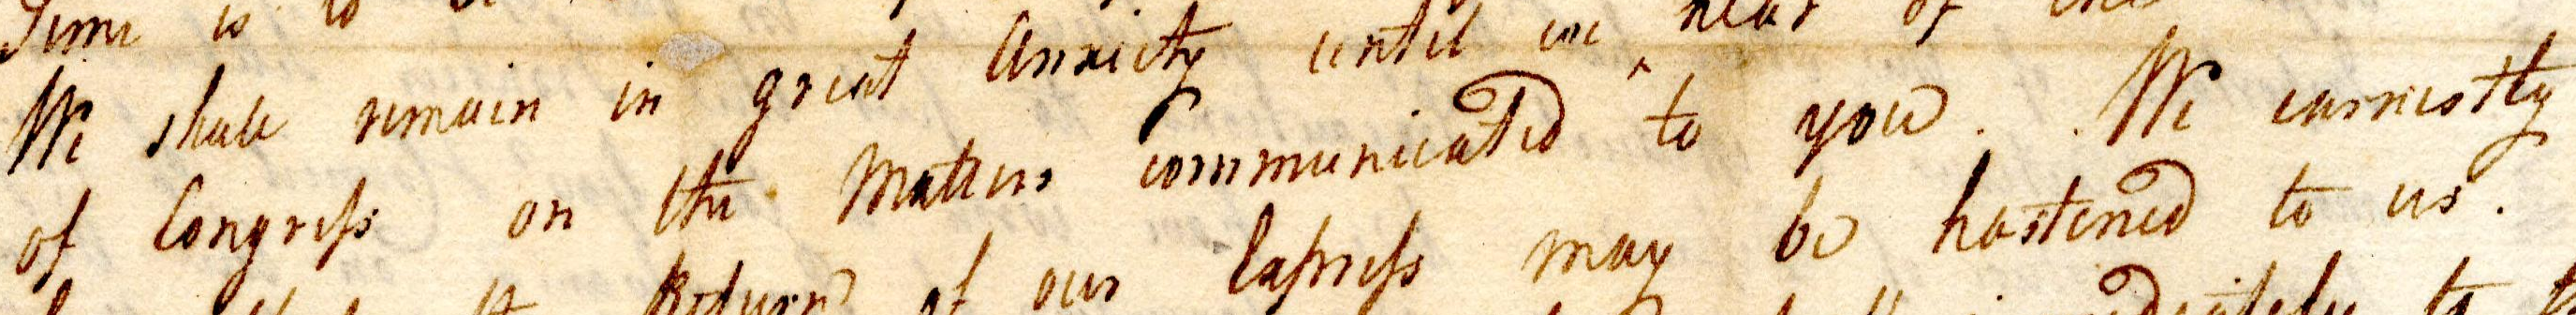of Congress on the matter communicated to you. We earnestly
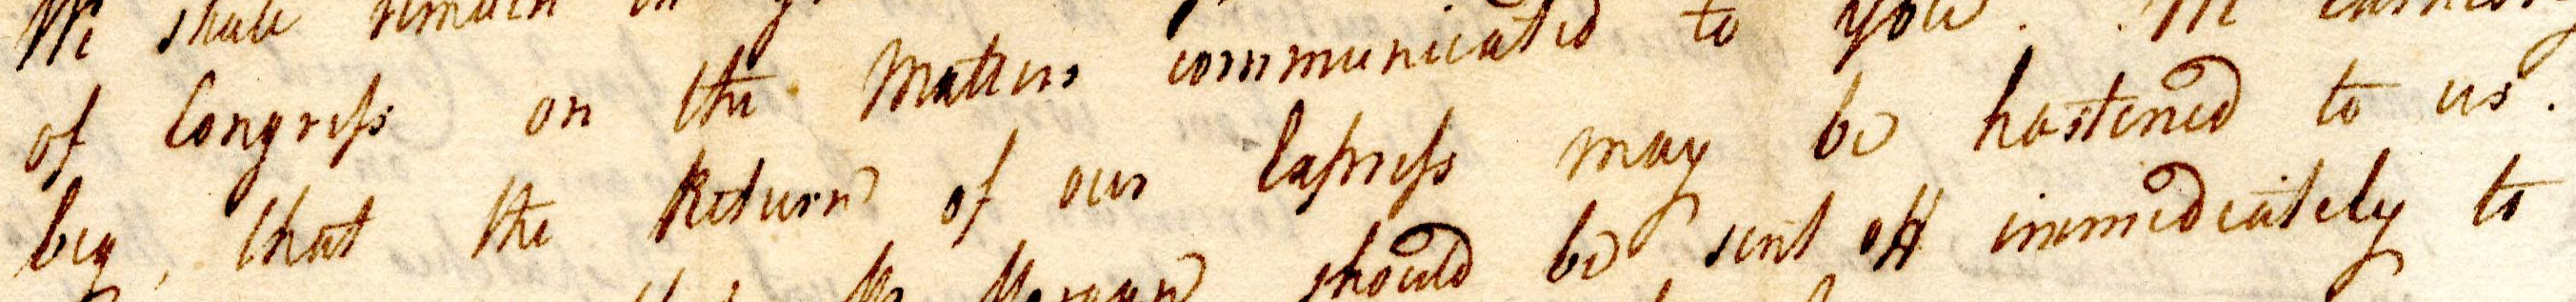beg, that the Return of our Express may be hastened to us.
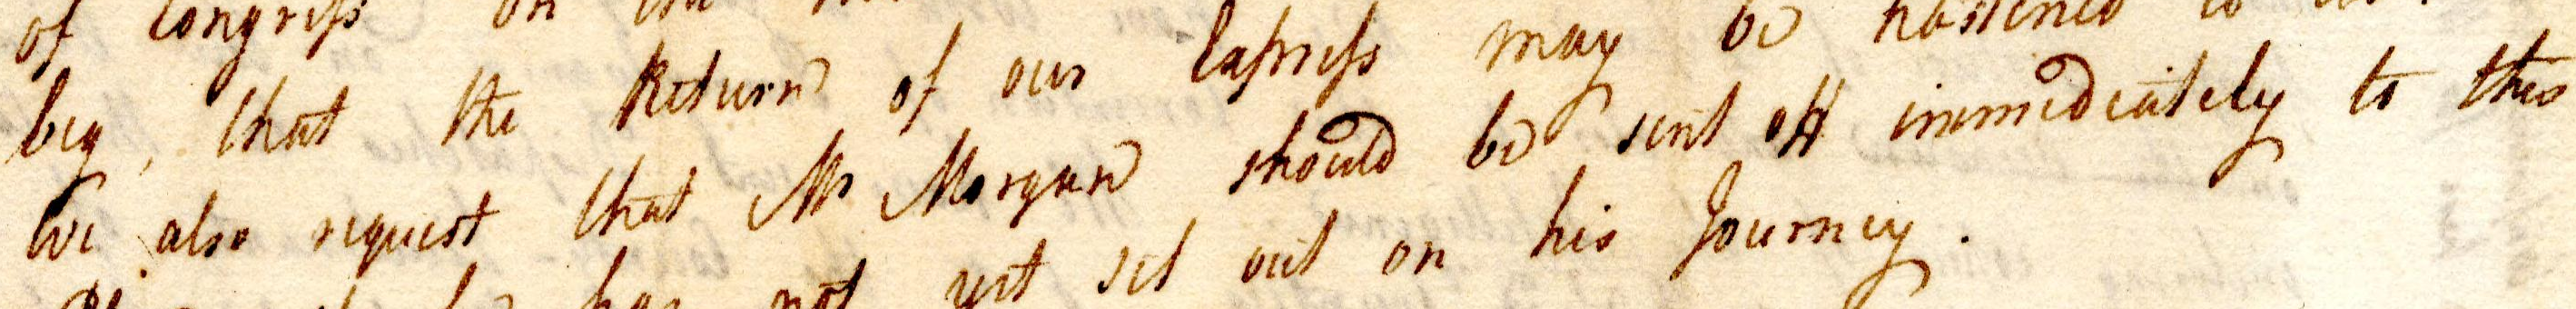We also request that M^r Morgan should be sent off immediately to the
